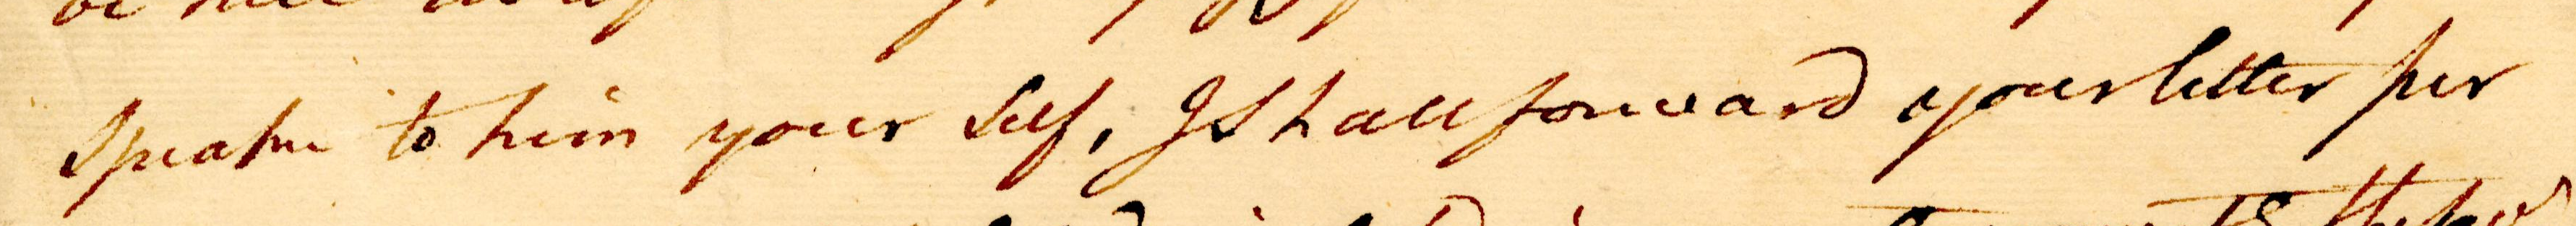speake to him your Self, I shall forward your letter per
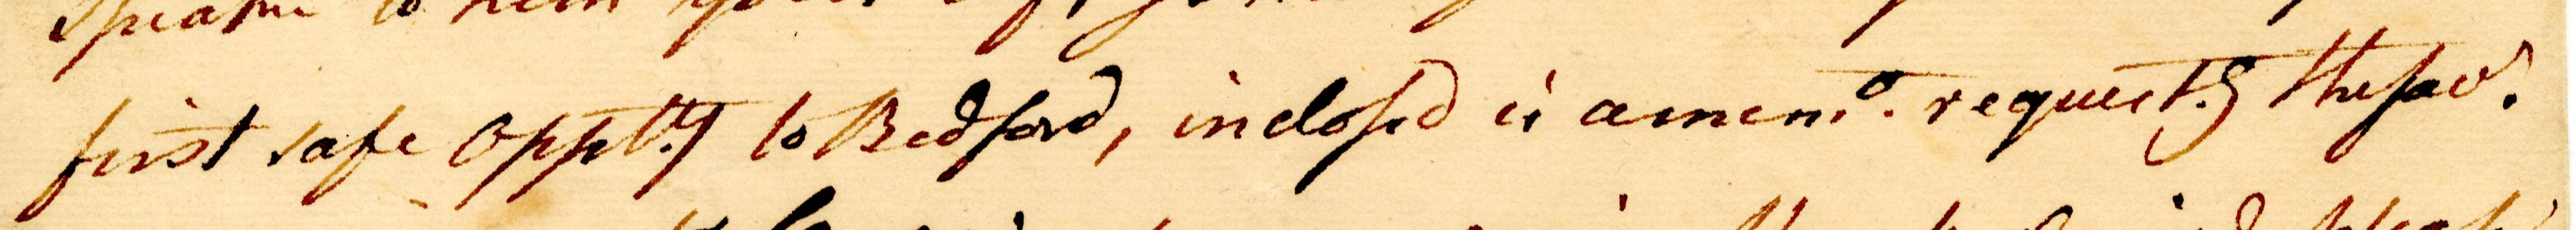first safe opp^ty. to Bedford, inclosed is amen^t request^g. of the fav^r.
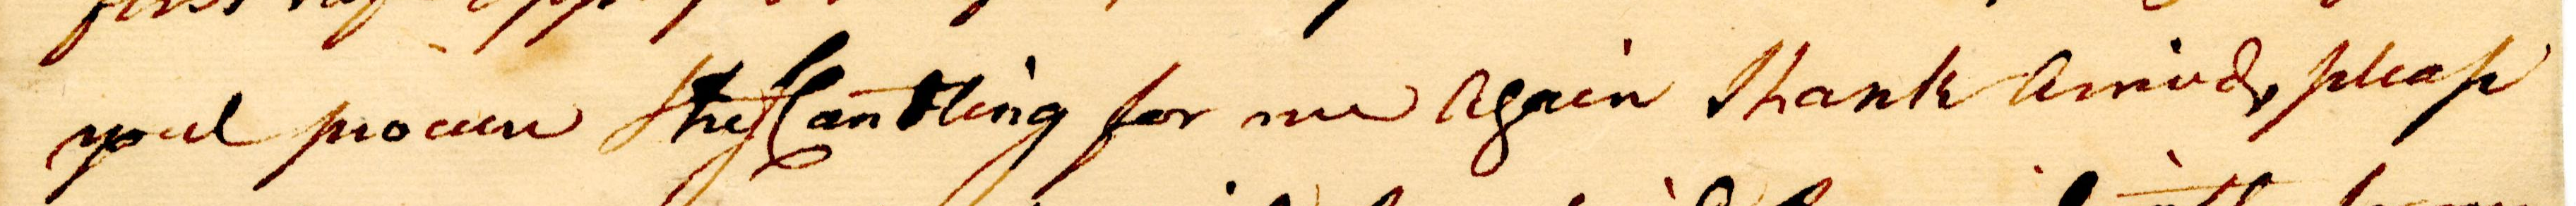you procure the Cantling for me again shank Arrivd, please
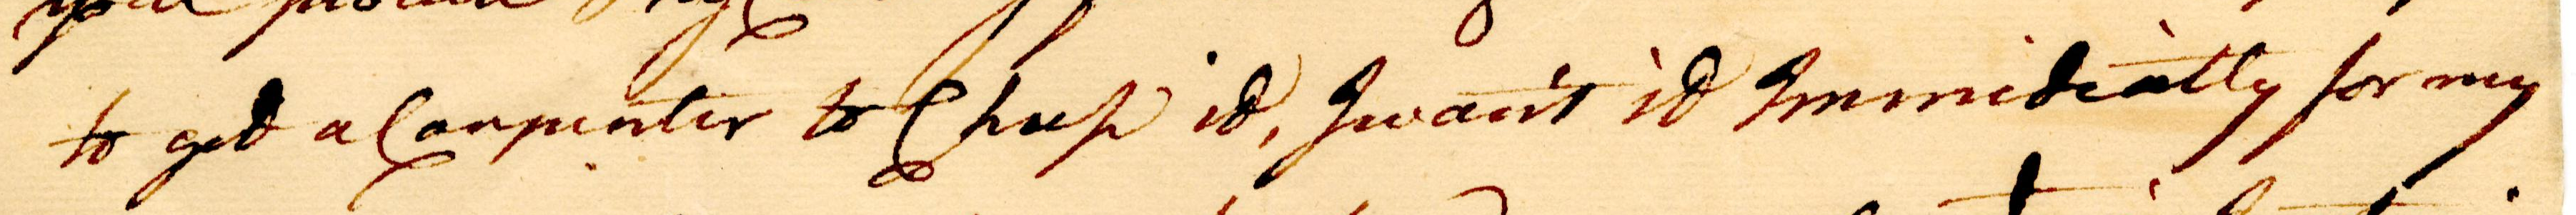to get a Carpenter to Chap it. I wan't id Immiediatly for my
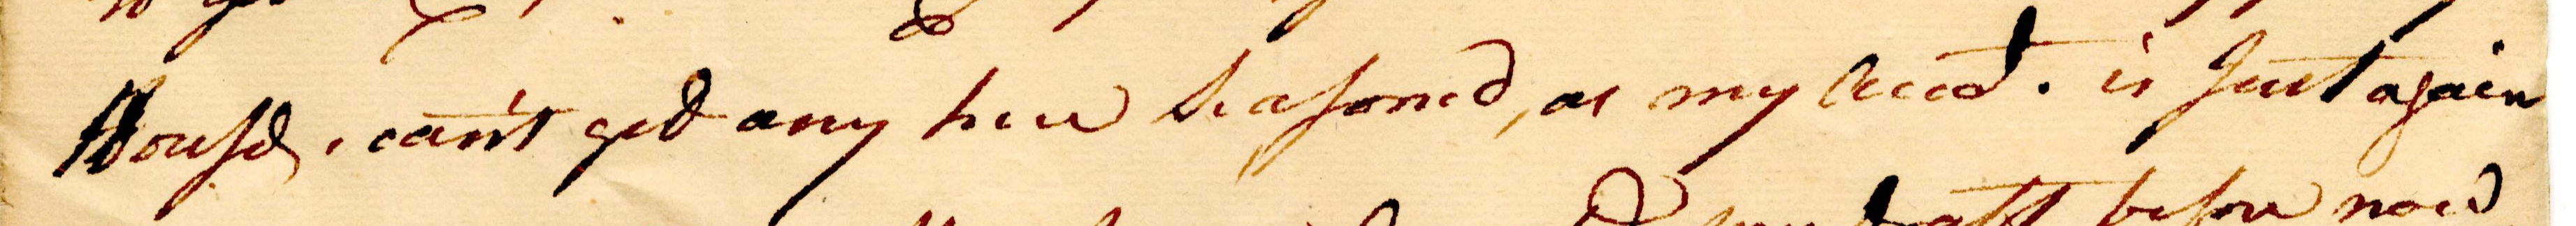Hould, cant get any here Seasoned, as my Acco^t. is Just again
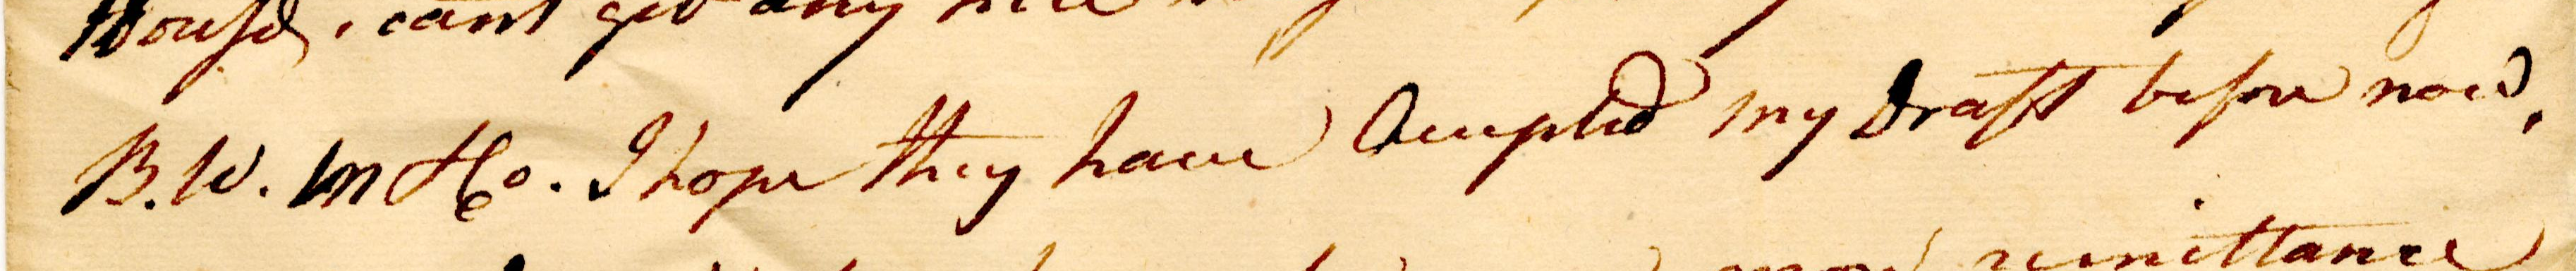B. W. &Co. I hope they have Accepted my Draft before now,
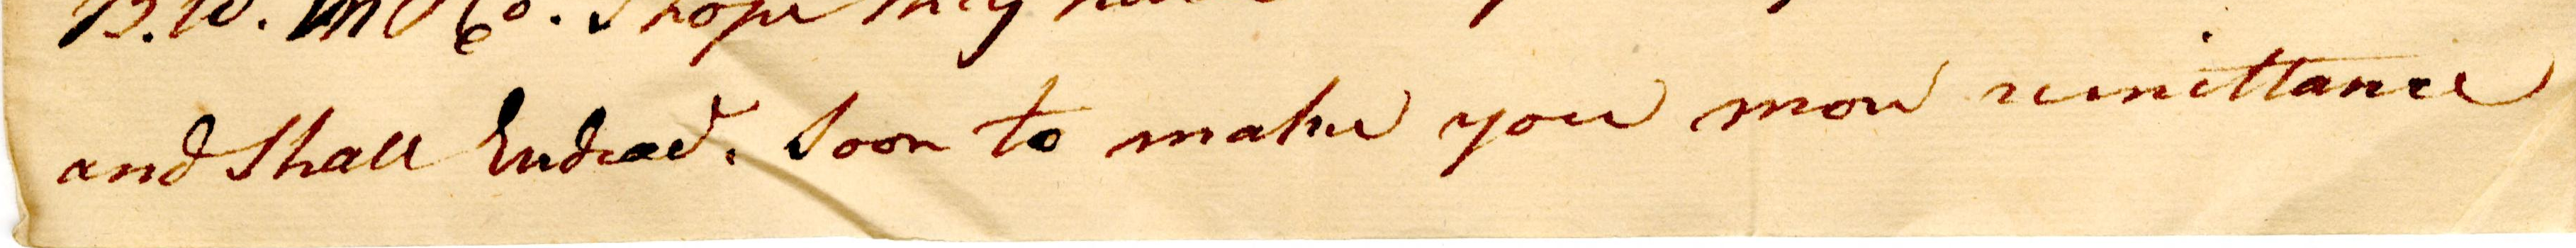and shall Endeav^r. soon to make you more remittance
